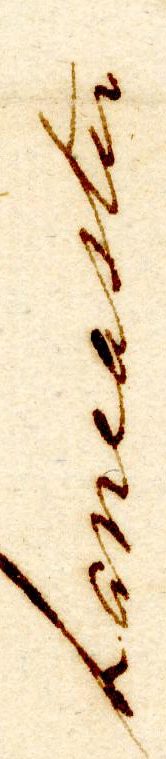Lancaster
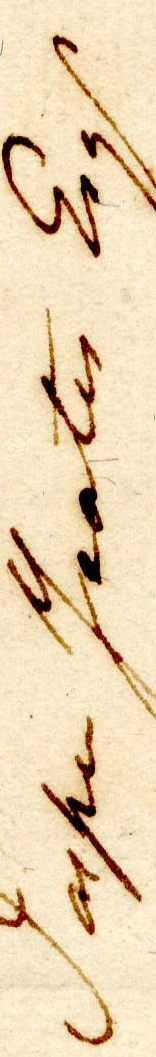Jasper Yeates Esq
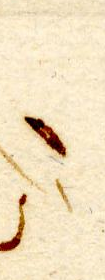To
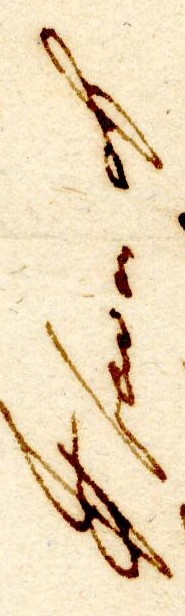Per favor of
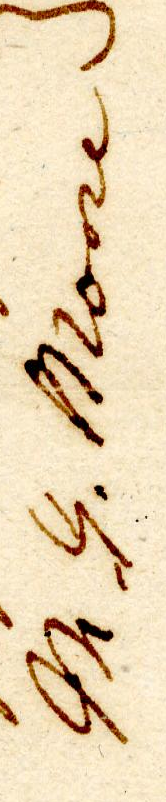M. G. Moore
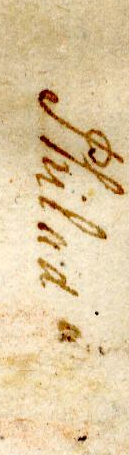Philad^a
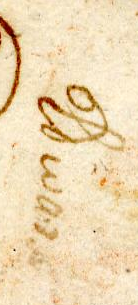Edward
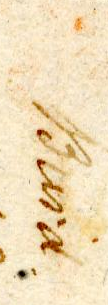Burd
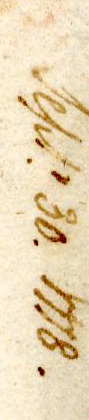Sept^r. 30. 1778.
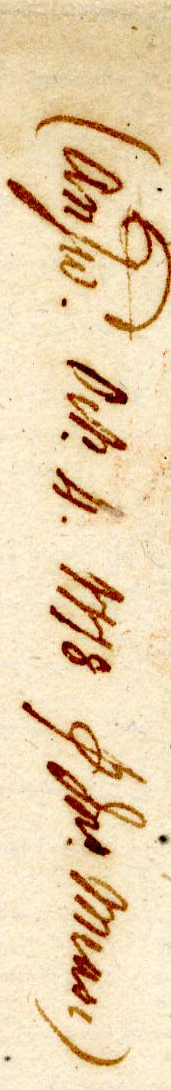(Answ^d. Oct^r. 4. 1778 per In^o. Mease)
